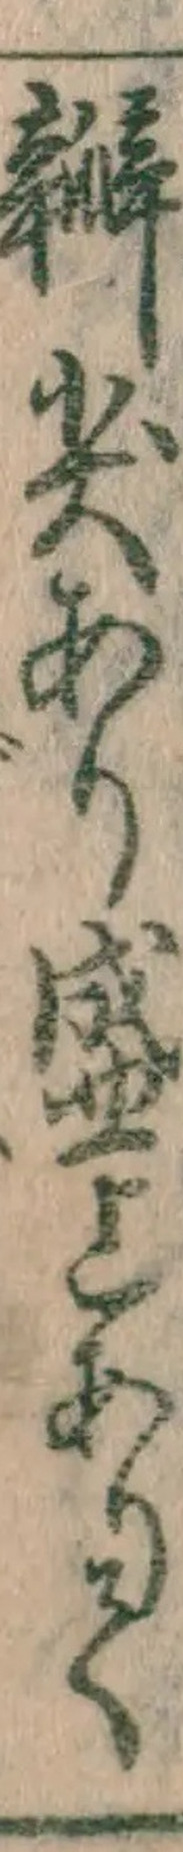弁尖あり盛上ありて
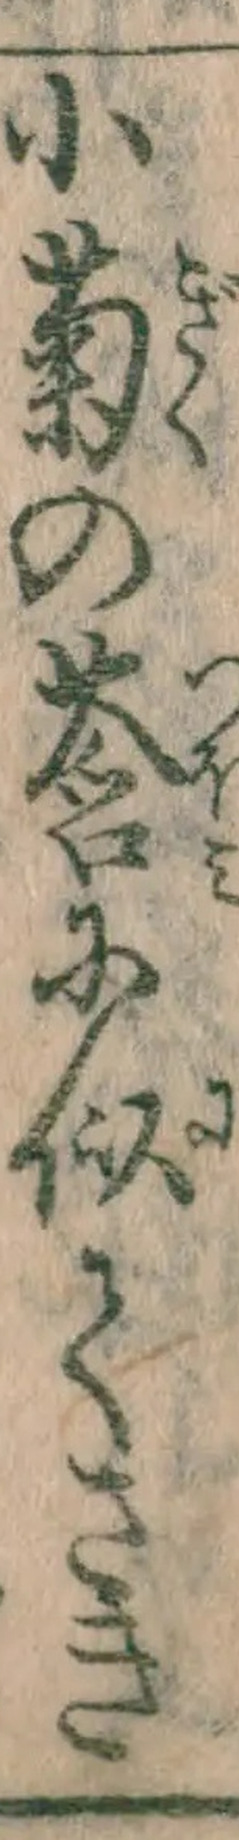小菊の莟に似てさき
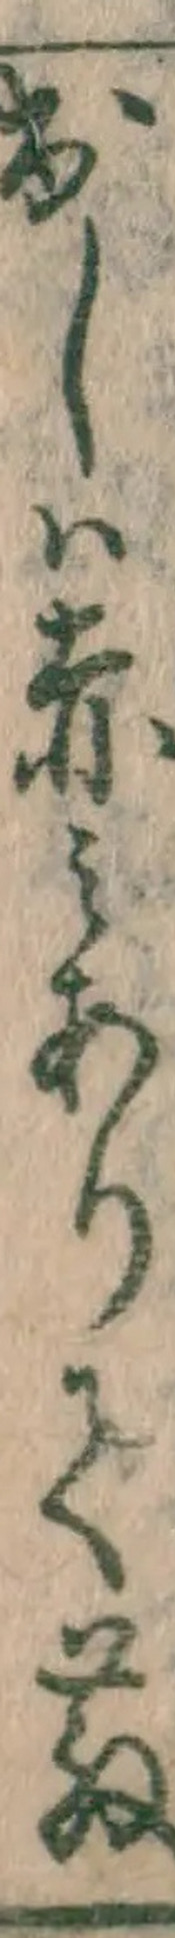出しは赤みありて散
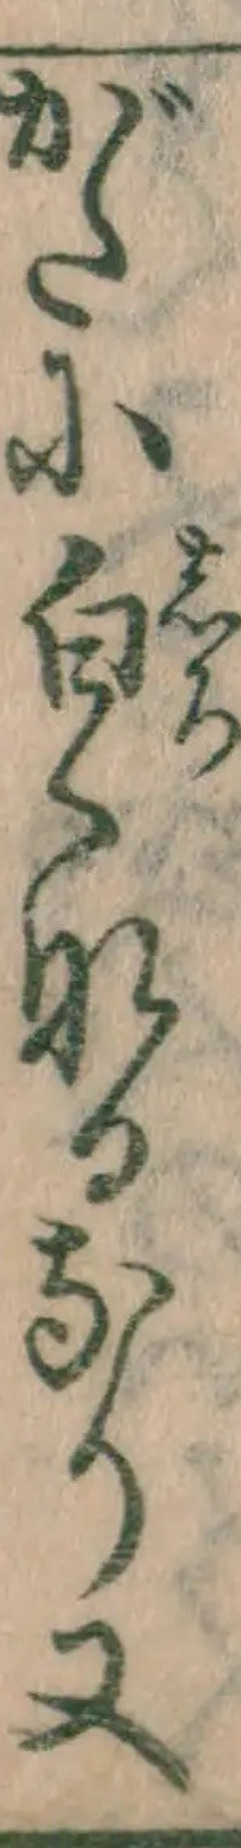がたに白くなるなり又
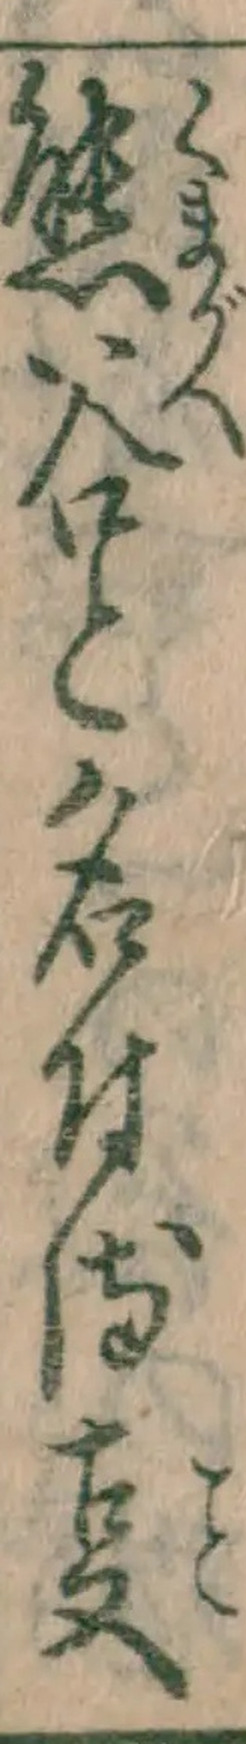熊谷と名付る事

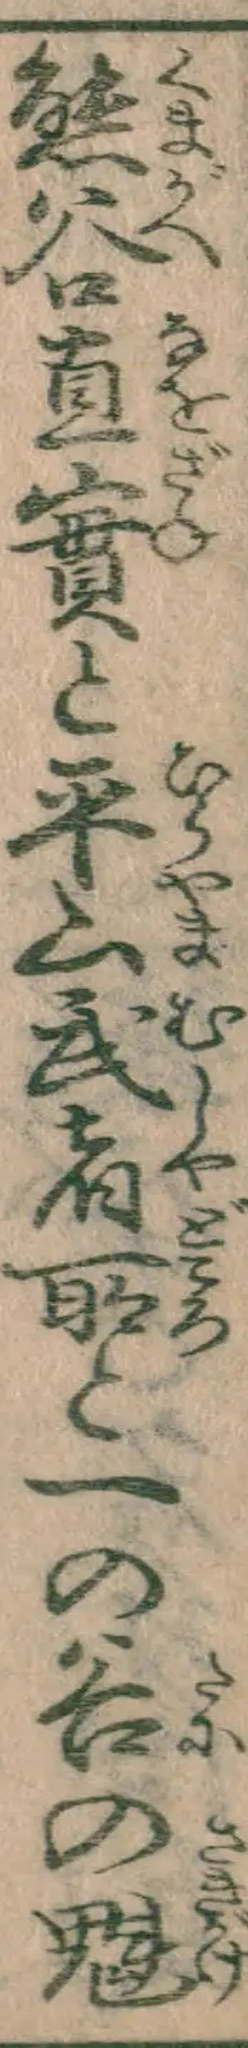熊谷直実と平山武者所と一の谷の魁
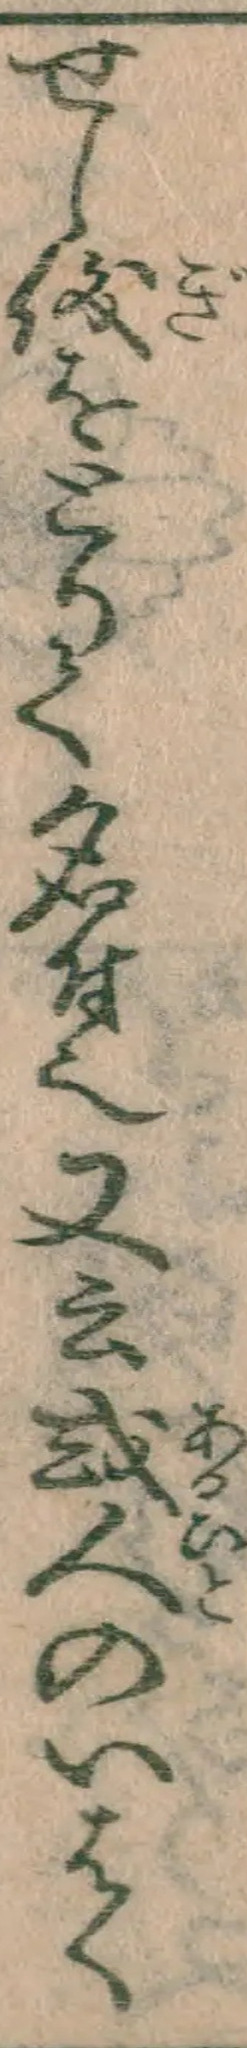せし儀をとりて名付也又云或人のいはく
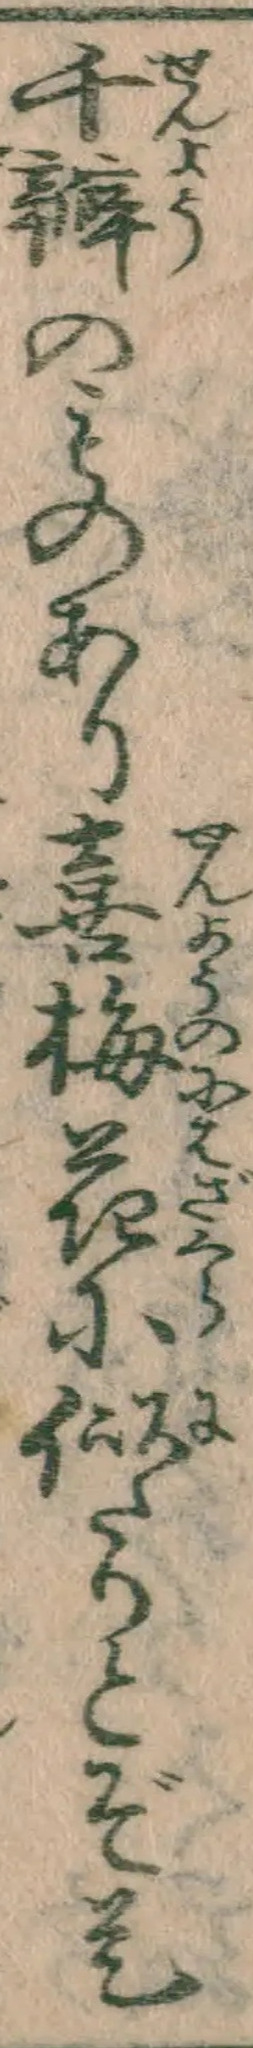千弁のものあり喜梅花に似たりとぞ是
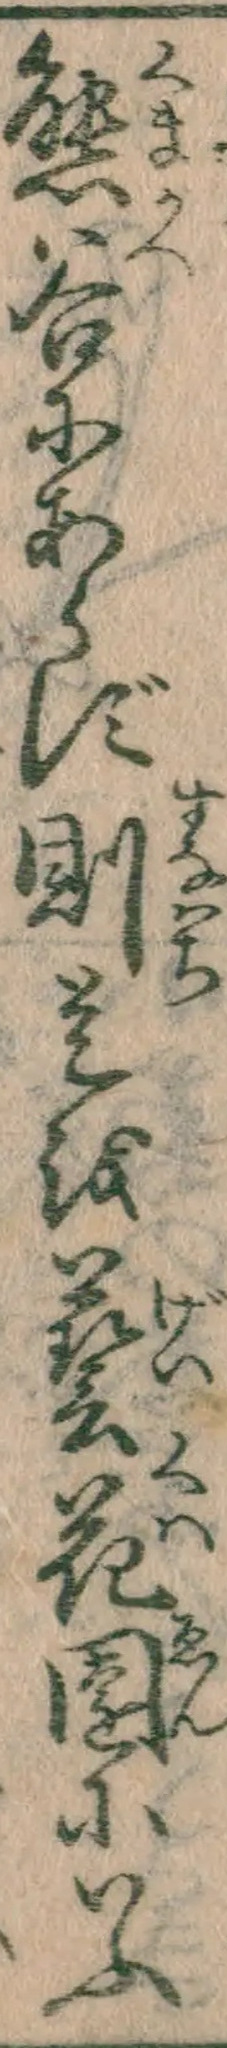熊谷にあらず則是を芸花園にいふ
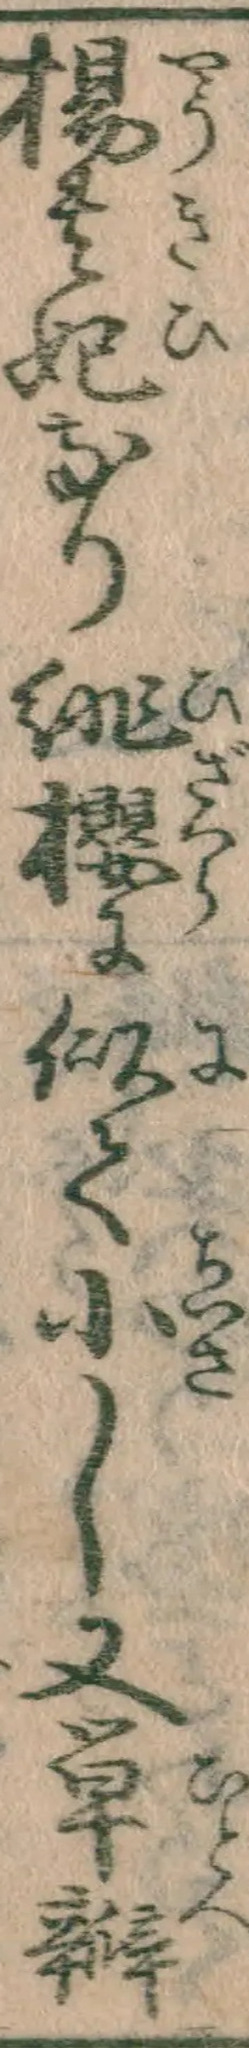楊貴妃なり緋桜に似て小し又単弁
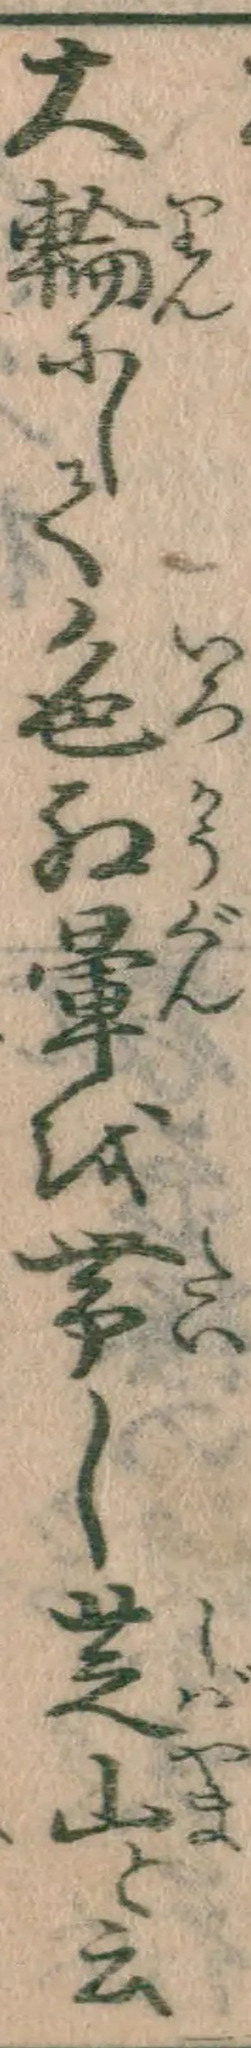大輪にして色紅暈を帯し芝山と云
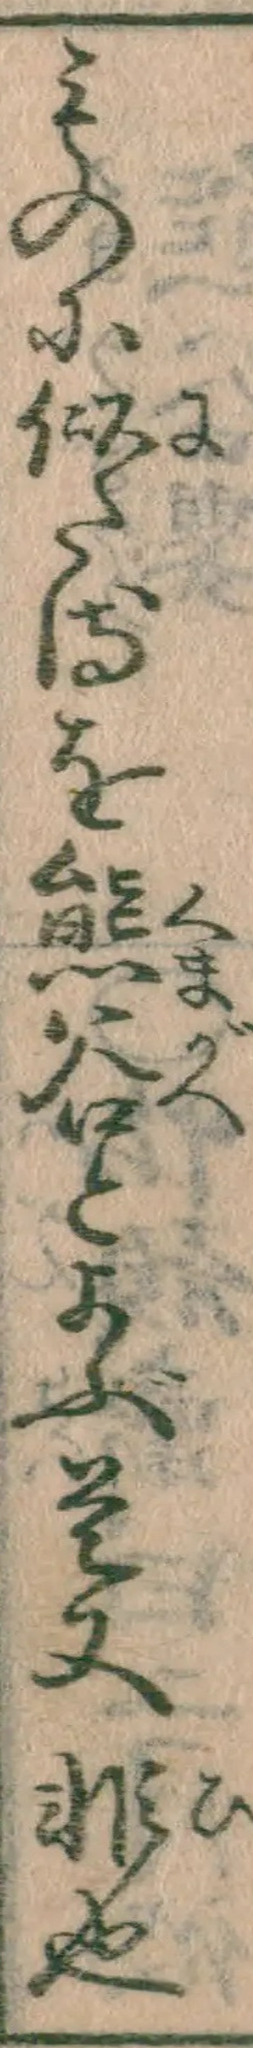ものに似たるを熊谷とよぶ是又非也
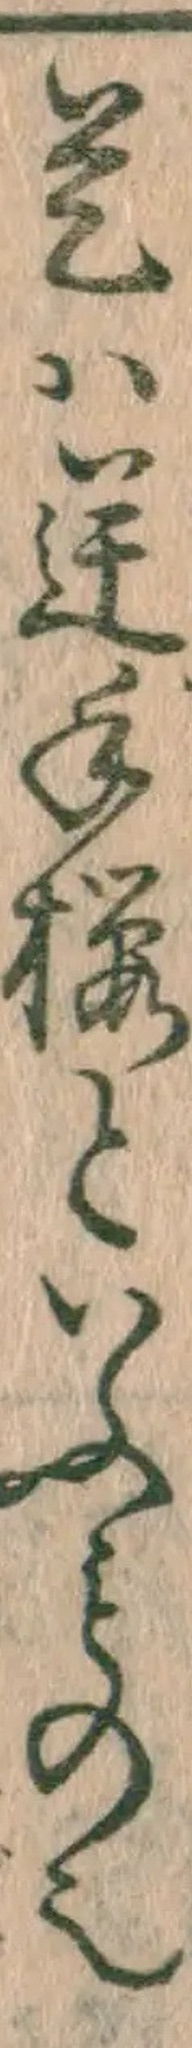是は逆手桜といふもの也
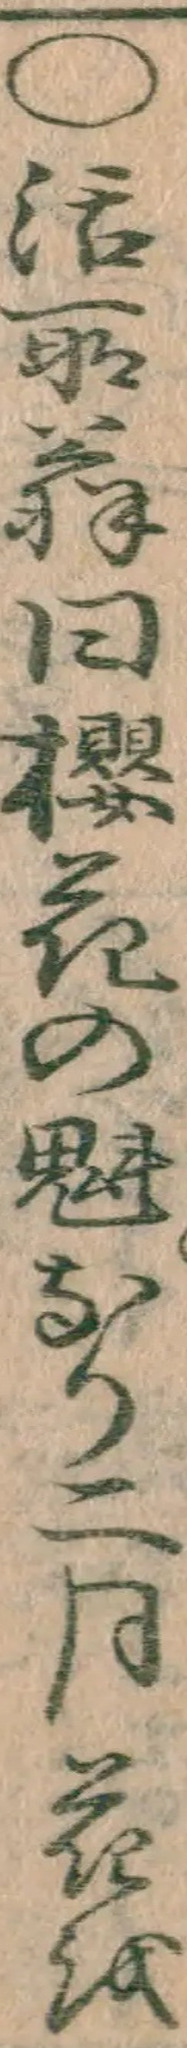○活所翁曰桜花の魁なり二月花を
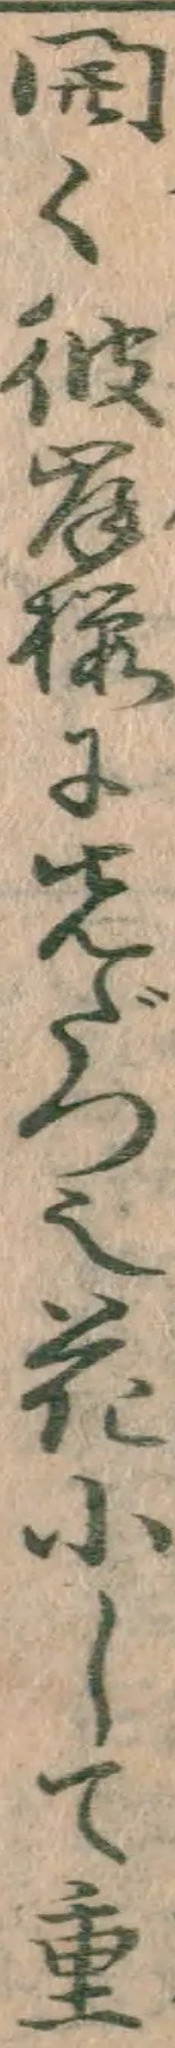開く彼岸桜に先だつ也花小して重
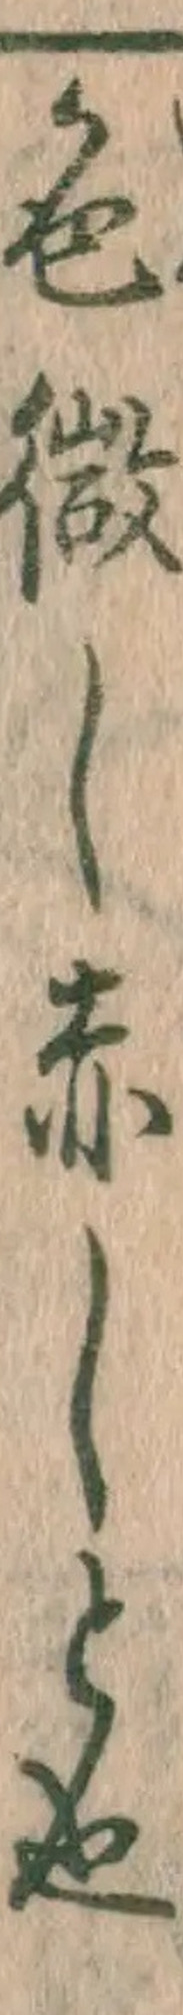色微し赤しと也
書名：怡顔齋櫻品
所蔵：国立国会図書館 National Diet Library, JAPAN
